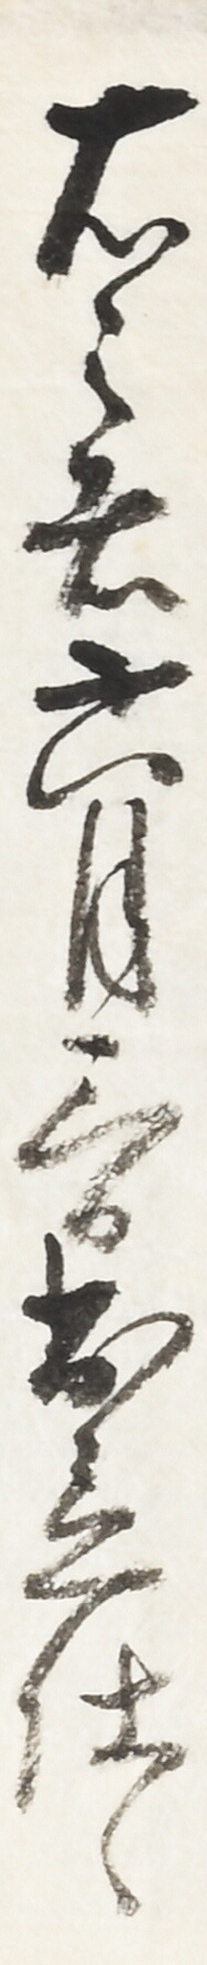右之者六月三日出立仕候
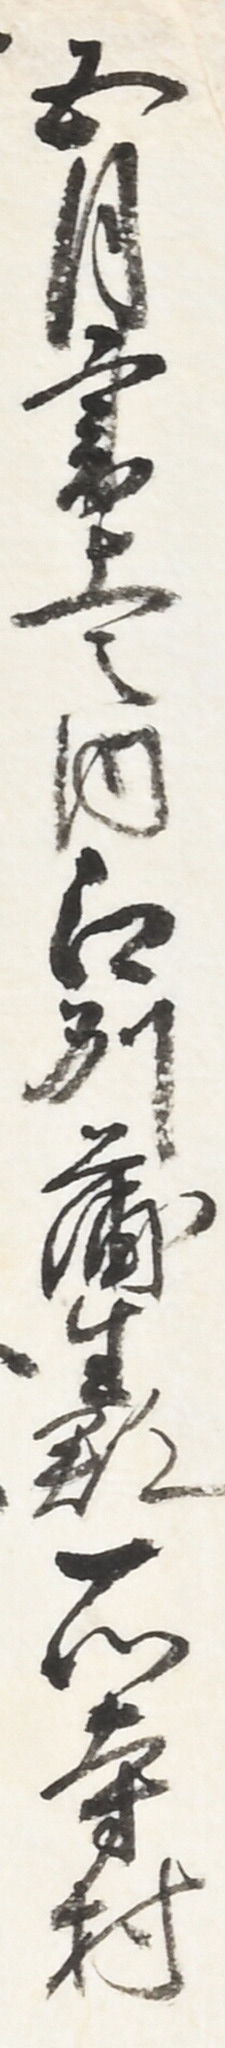五月書上之内江州蒲生郡石寺村
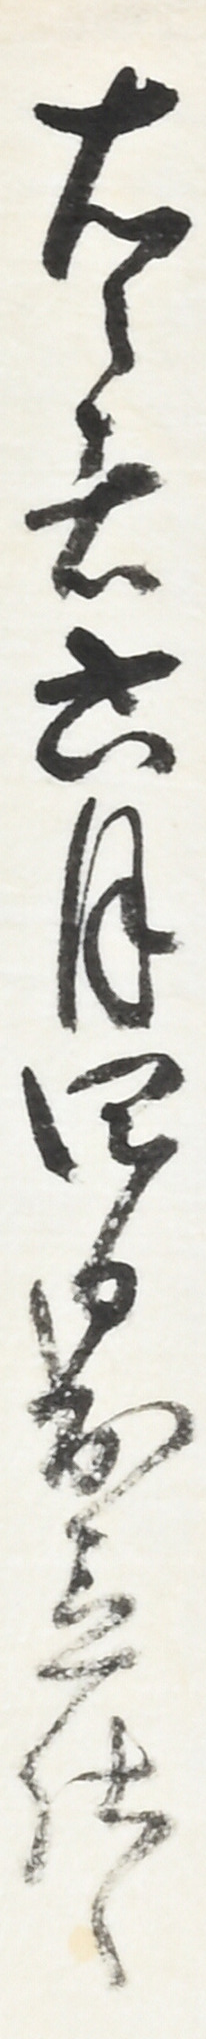右之者六月四日出立仕候

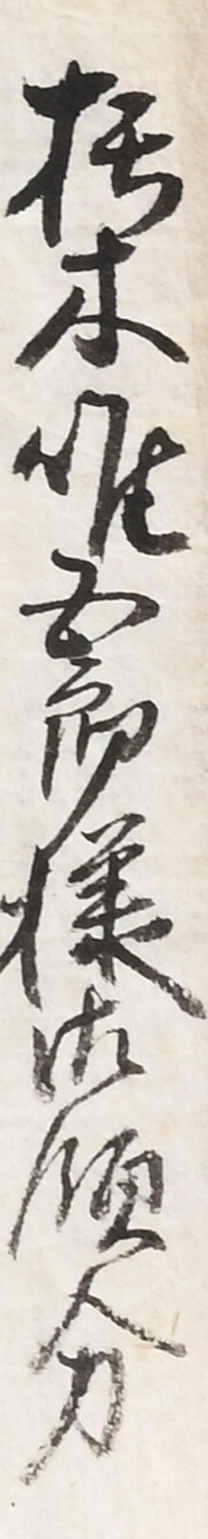朽木唯五郎様御領分
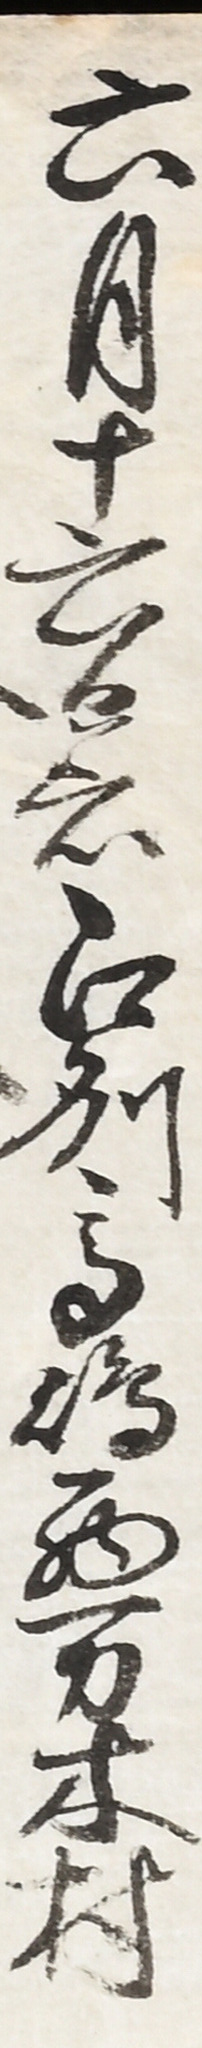六月十六日着江州高嶋西万木村
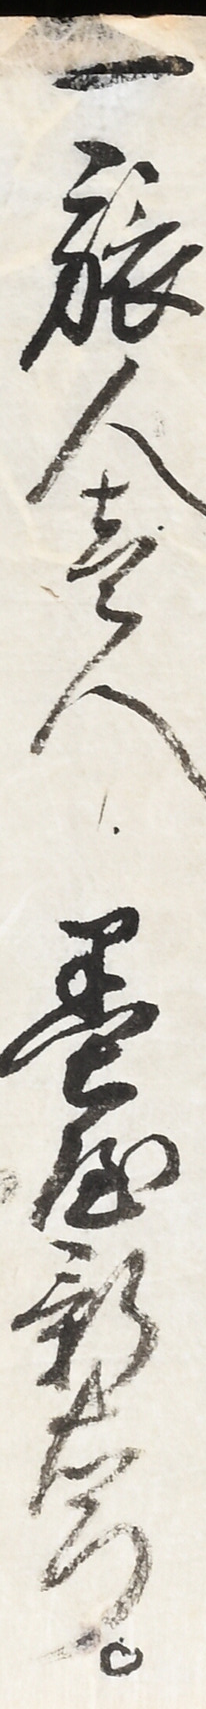一旅人壱人墨屋新右衛門〇
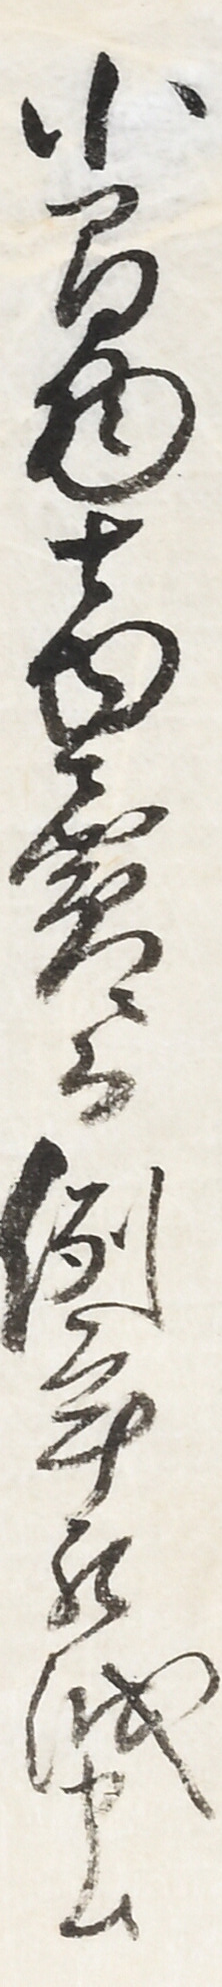小間物商売ニ而例年罷越申候
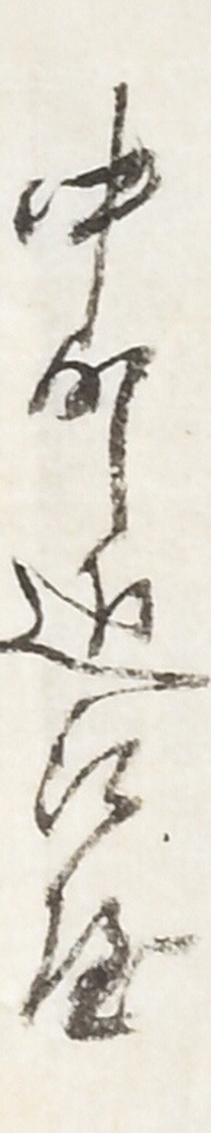中町近江屋
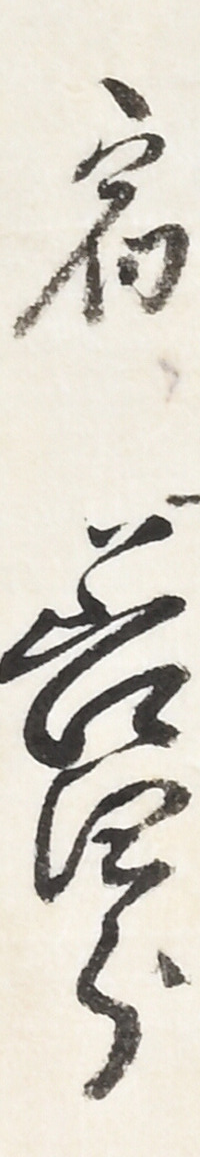宿善四郎
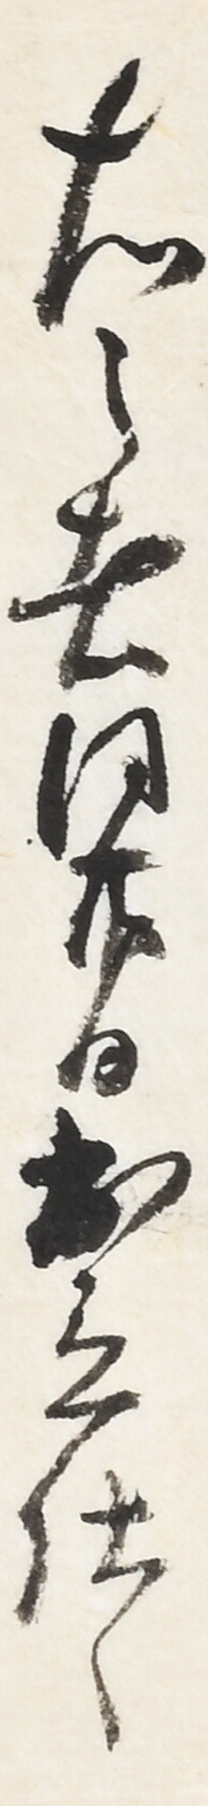右之者同廿日出立仕候
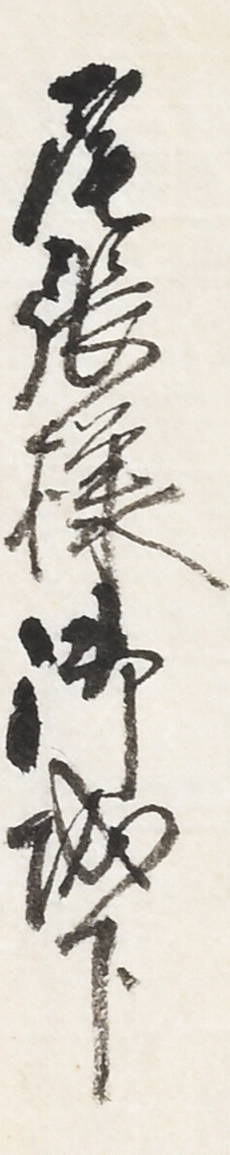尾張様御城下
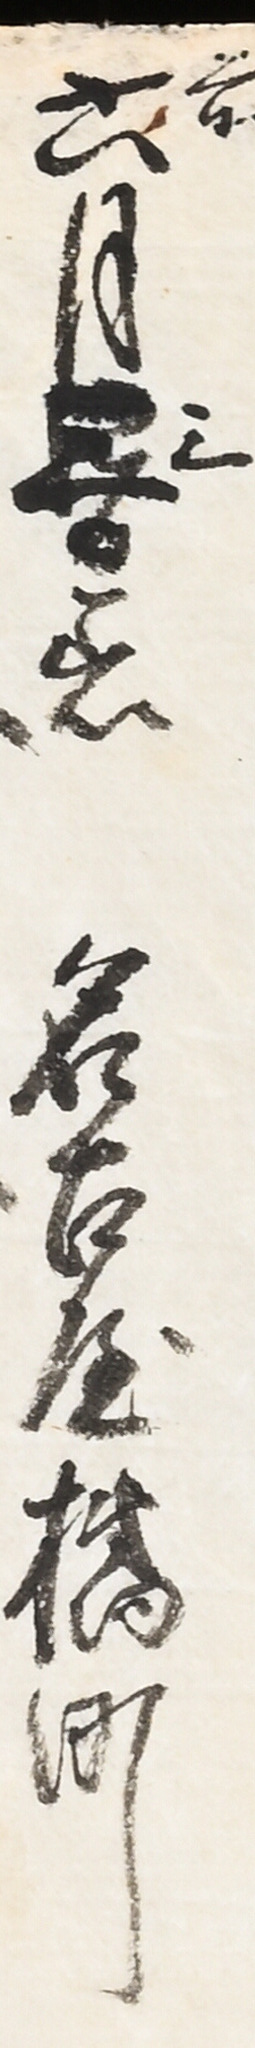六月三日着名古屋橘町
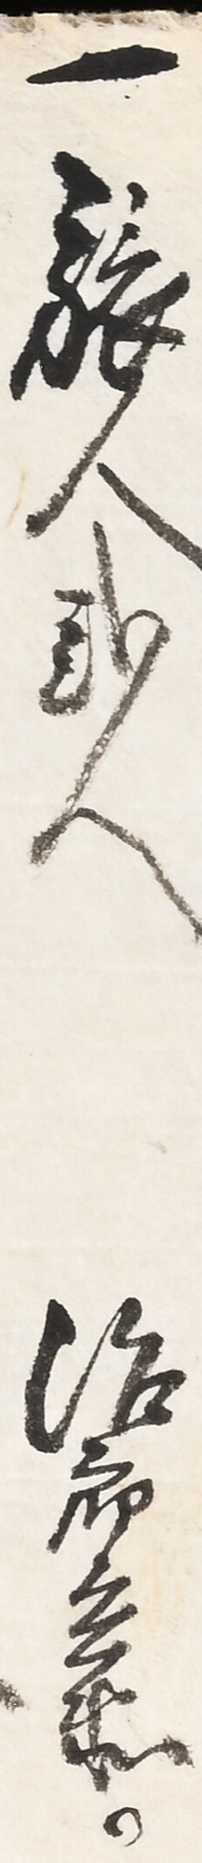一旅人弐人治郎兵衛〇
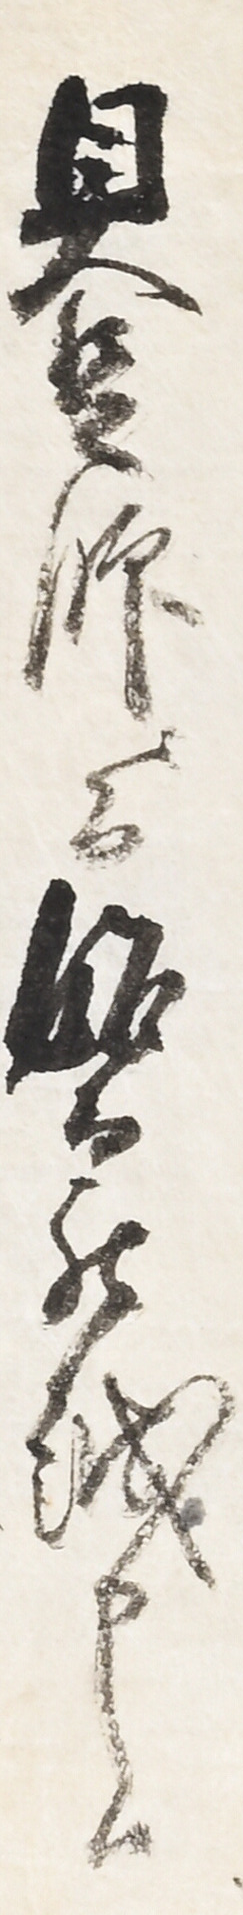具足師ニ而始而罷越申候
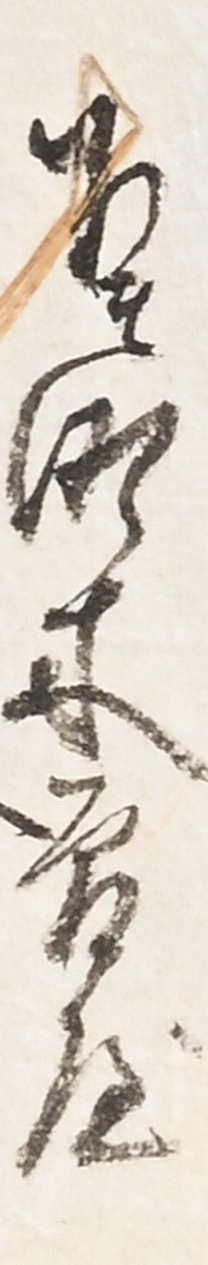下モ町木曽屋
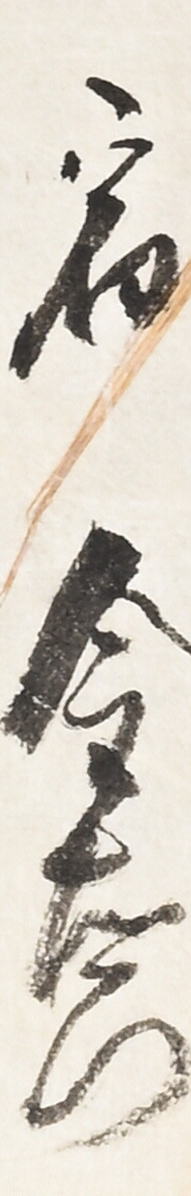宿金右衛門
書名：旅人泊控帳
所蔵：伊那市立高遠町図書館・合同会社AMANE
